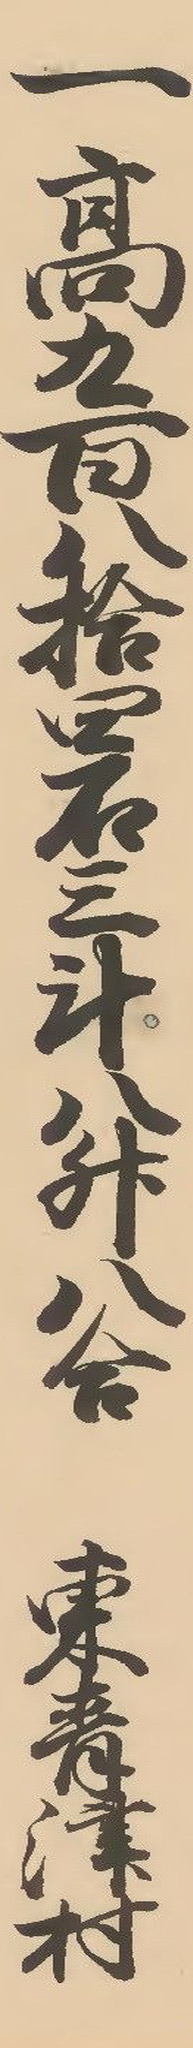一高九百八拾四石三斗八升八合東青津村
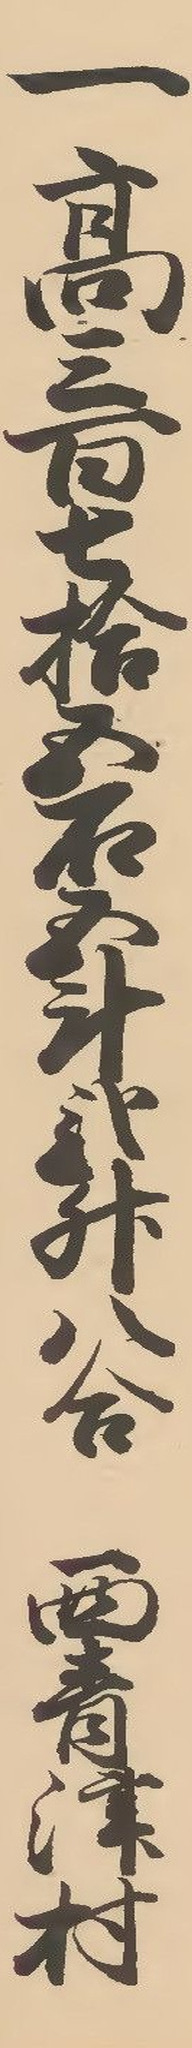一高三百七拾五石五斗弐升八合西青津村
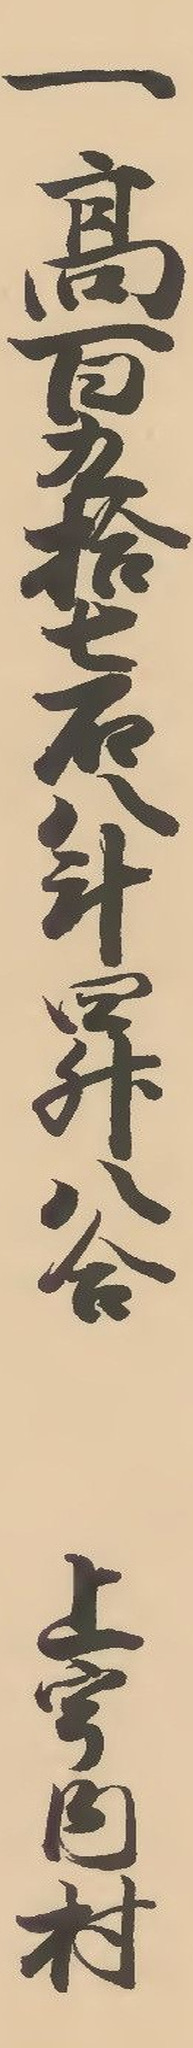一高百九拾七石八斗四升八合上宇内村
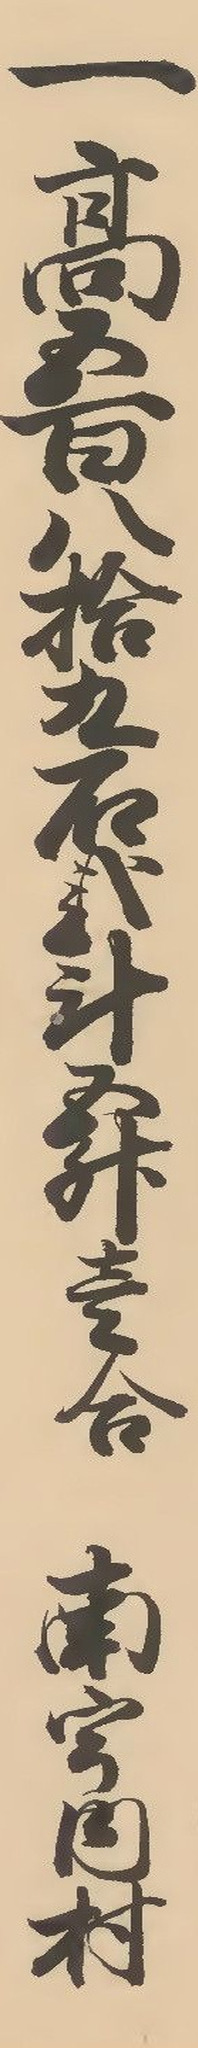一高五百八拾九石弐斗五升壱合南宇内村
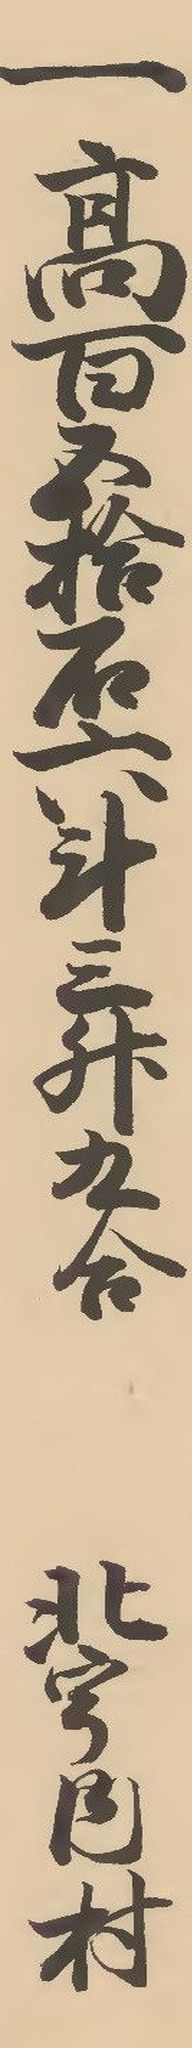一高百五拾石六斗三升九合宇内村
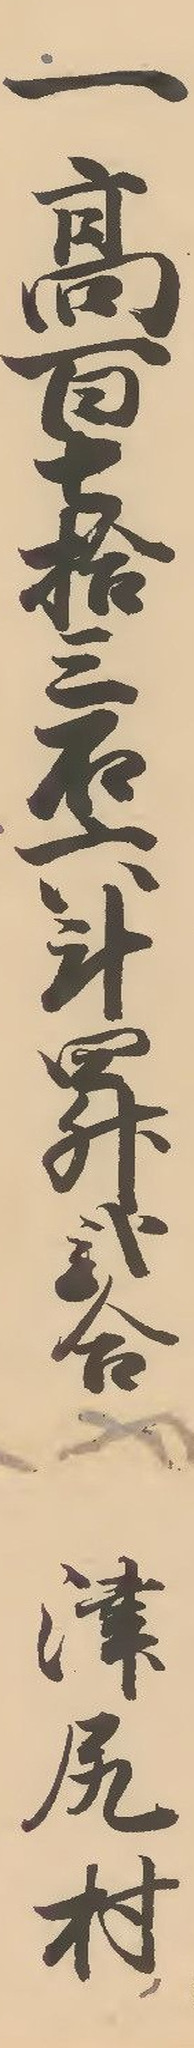一高百七拾三石六斗四升弐合津尻村

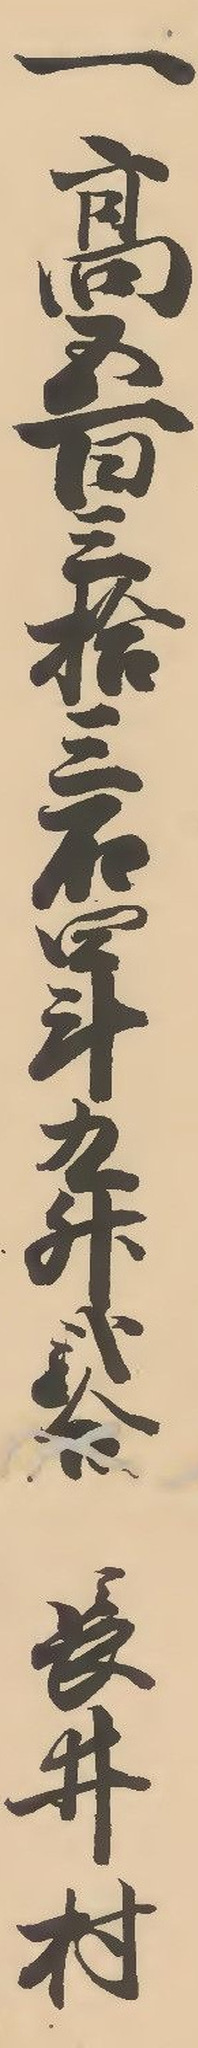一高五百三拾三石四斗九升弐合長井村
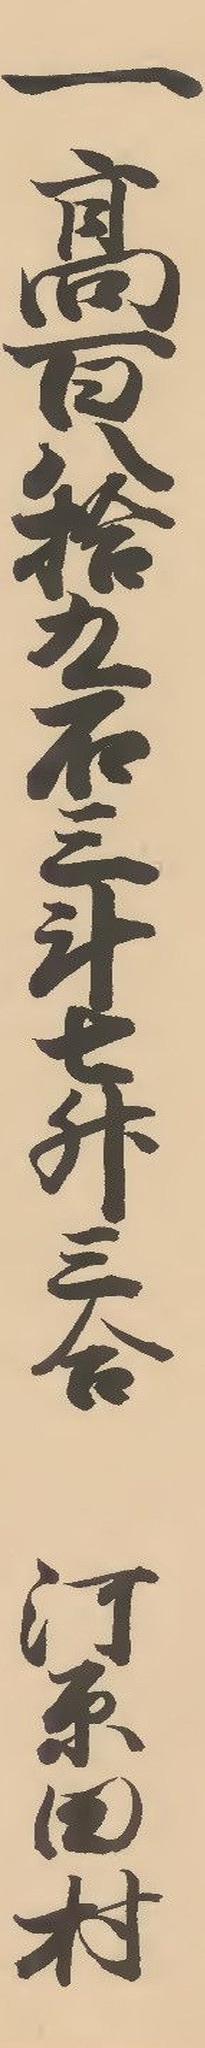一高百八拾九石三斗七升三合河原田村
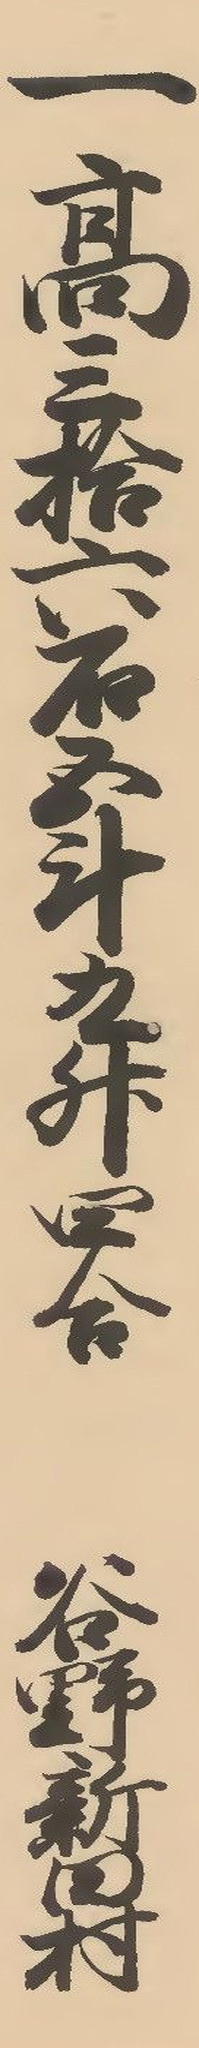一高三拾六石五斗九升四合谷野新田村
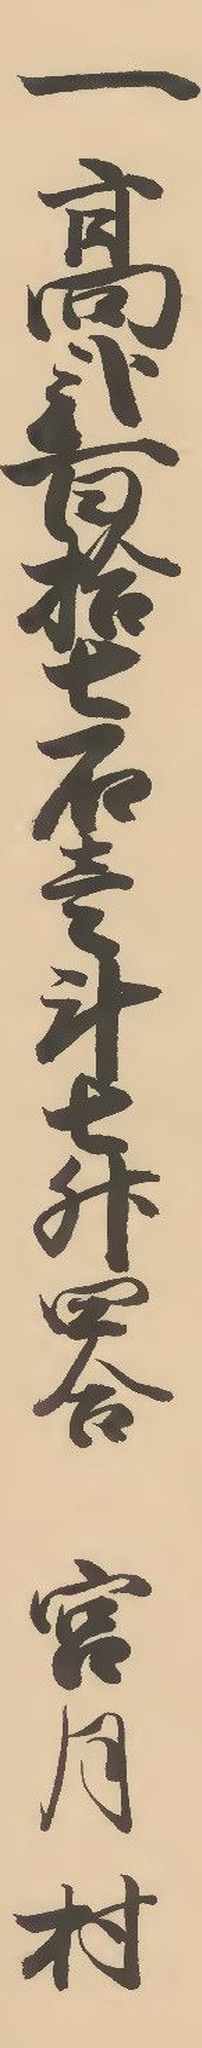一高弐百拾七石壱斗七升四合宮月村
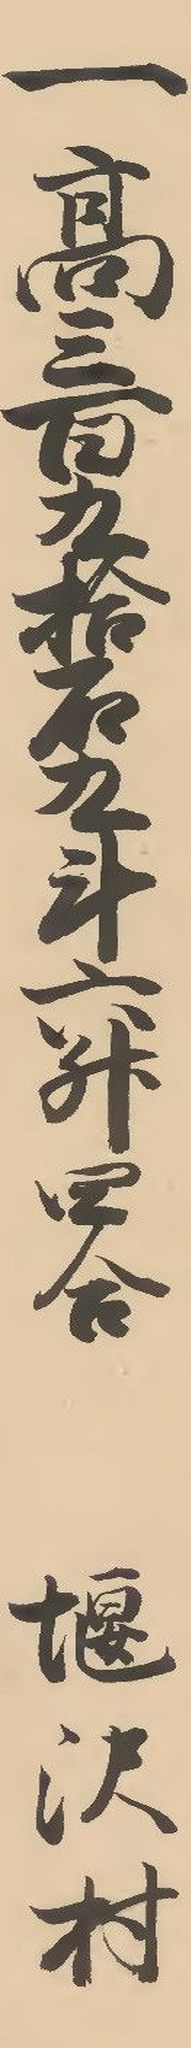一高三百九拾石九斗六升四合堰沢村
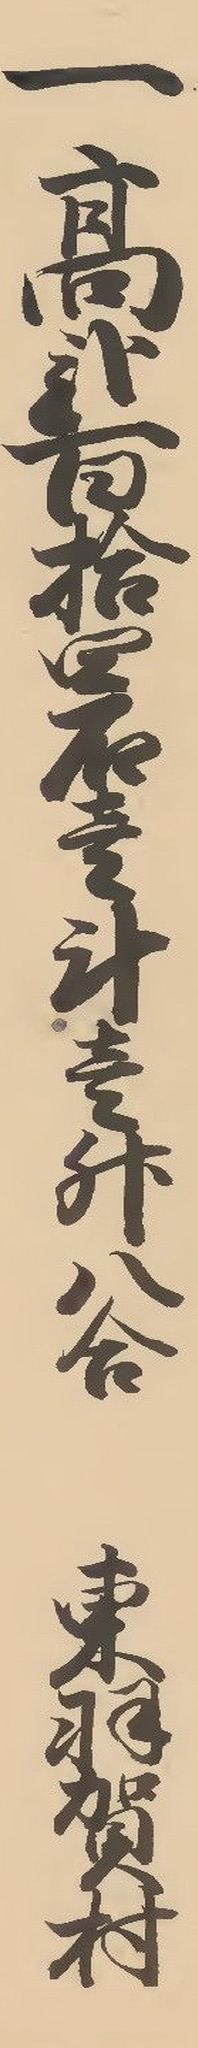一高弐百拾四石壱斗壱升八合東羽賀村
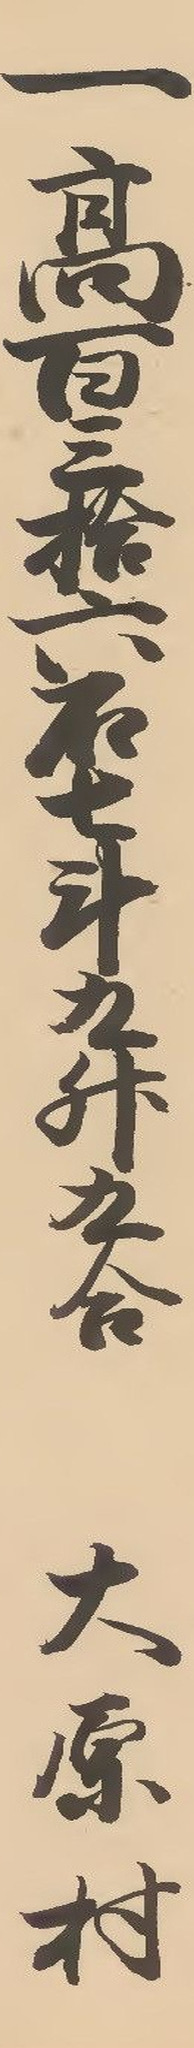一高百三拾六石七斗九升九合大原村
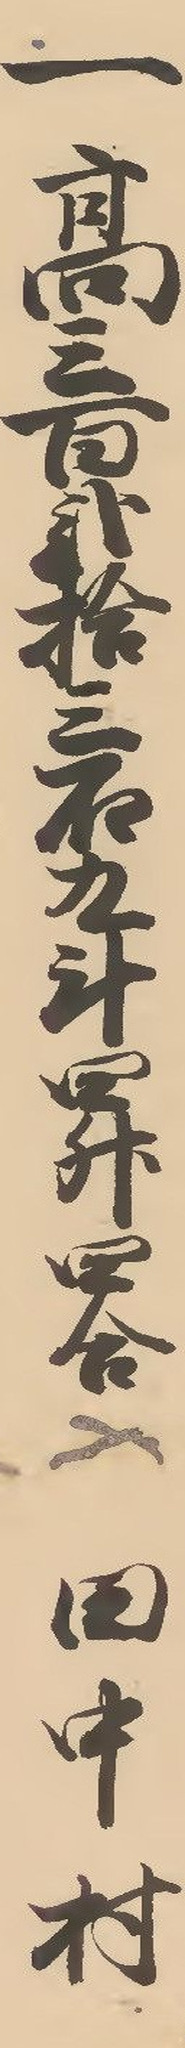一高三百弐拾三石九斗四升四合田中村

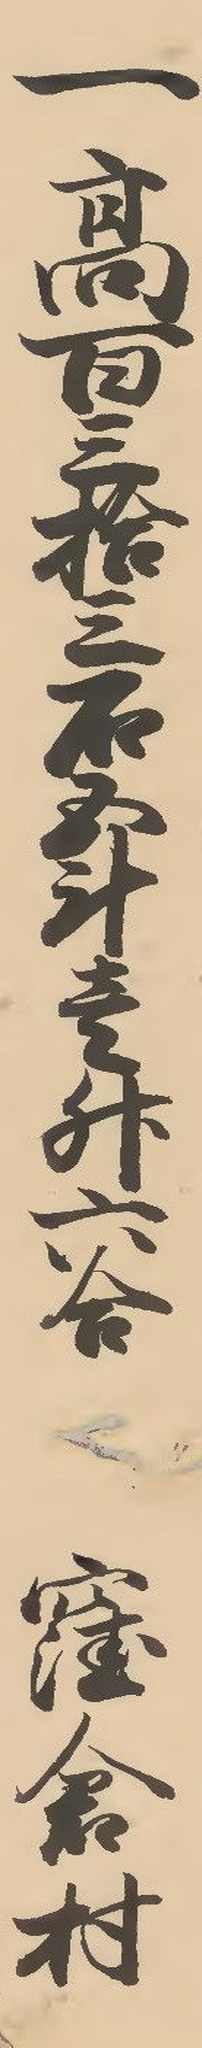一高百三拾三石五斗壱升六合窪倉村
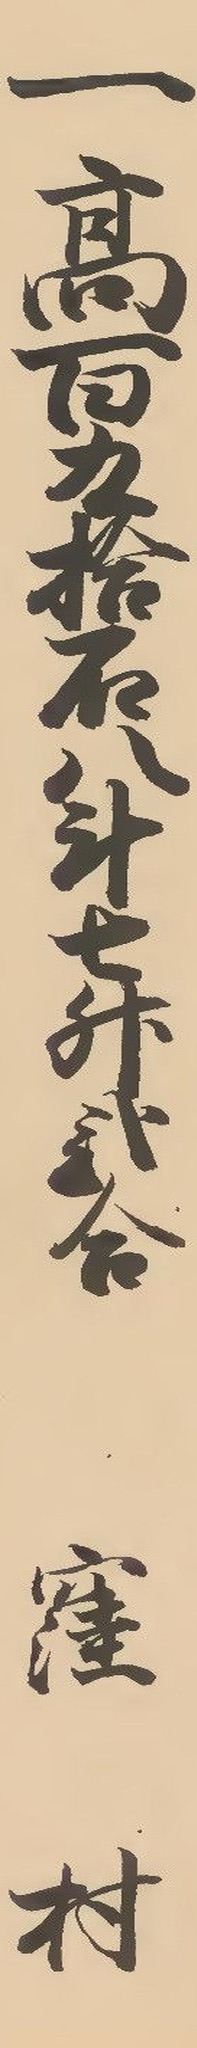一高百九拾石八斗七升弐合窪村
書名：陸奥国郷帳　１
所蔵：国立公文書館 National Archives of Japan
